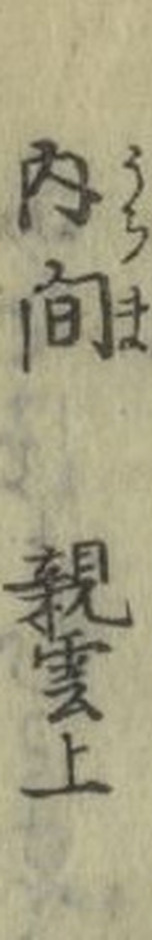内間親雲上
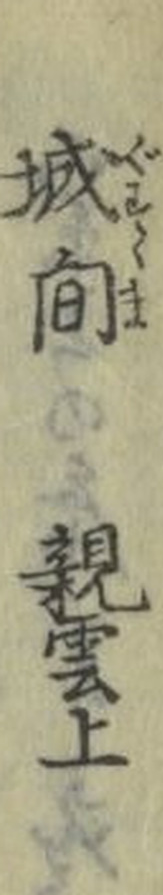城間親雲上
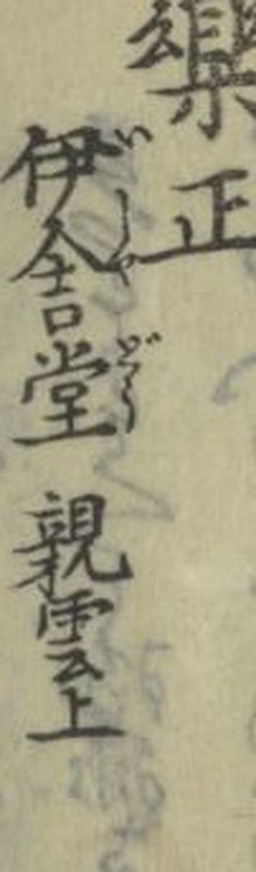伊舎堂親雲上
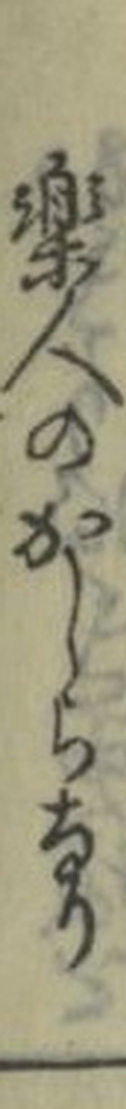樂人のかしらなり
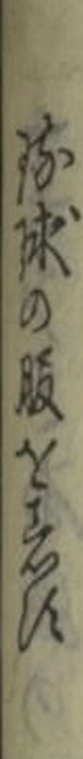琉球の服を着す
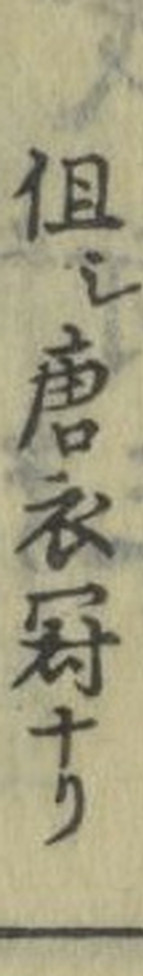但唐衣冠ナリ
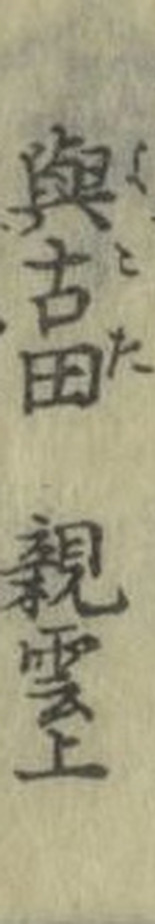與古田親雲上
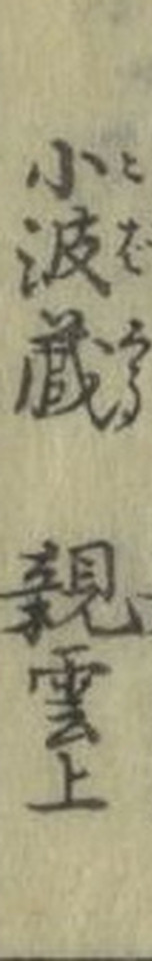小波蔵親雲上

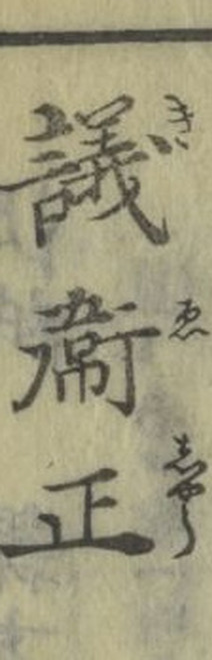議衛正
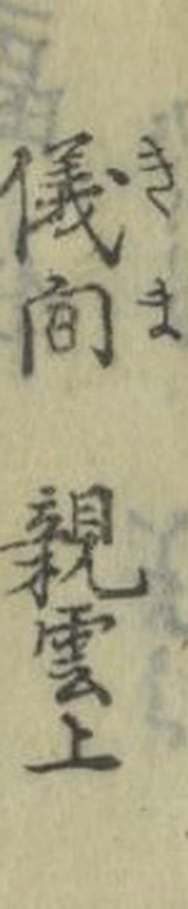儀間親雲上
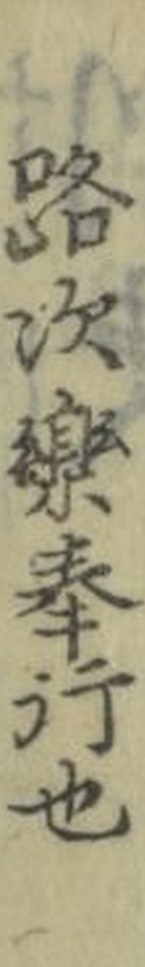路次樂奉行也
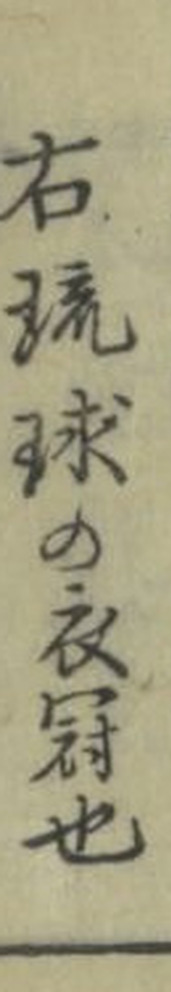古琉球の衣冠也
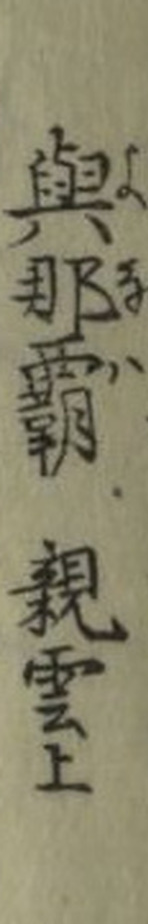與那覇親雲上
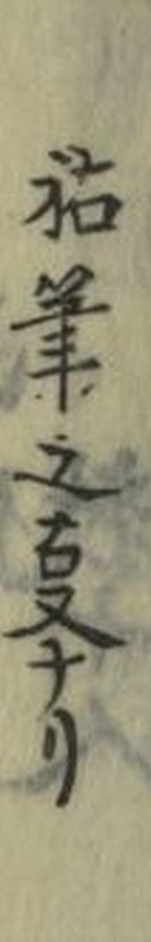祐筆之㕝ナリ
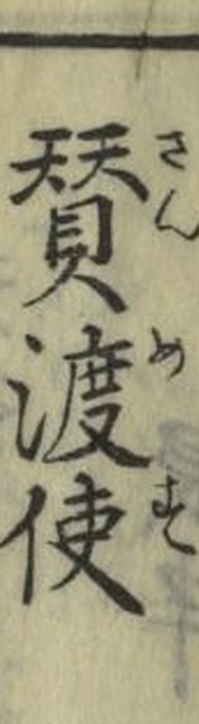賛渡使
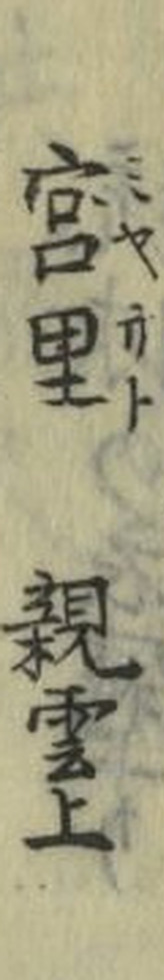宮里親雲上
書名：新板 琉球人行列記
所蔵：University of the Ryukyus Library
